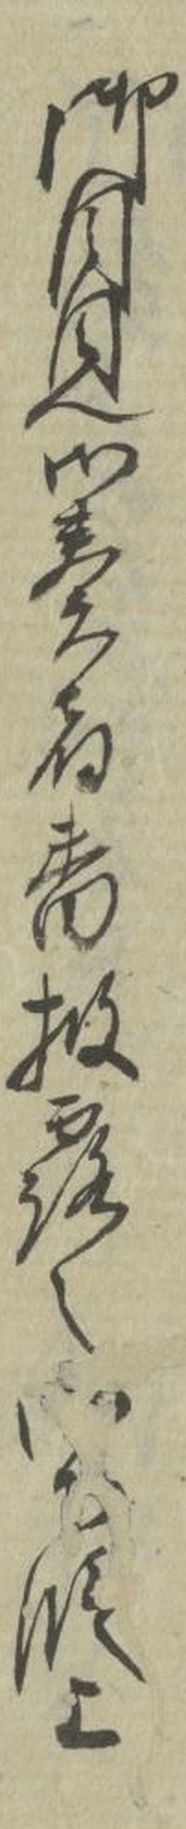御目見御奏者番披露之御下段上
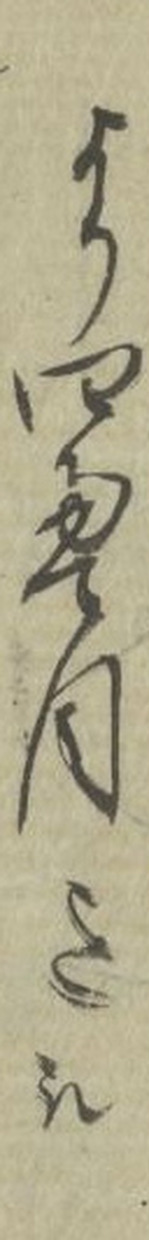より四畳目迄被
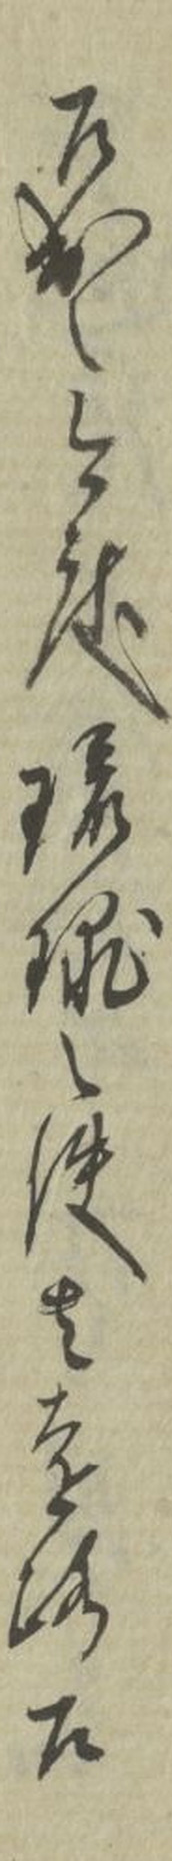召出之今度琉球之使者遠路召
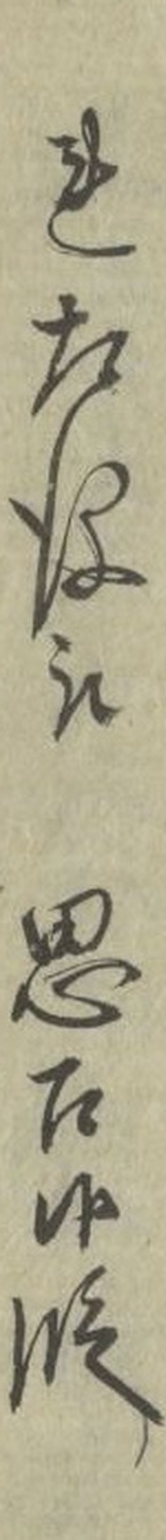連太儀被思召候段

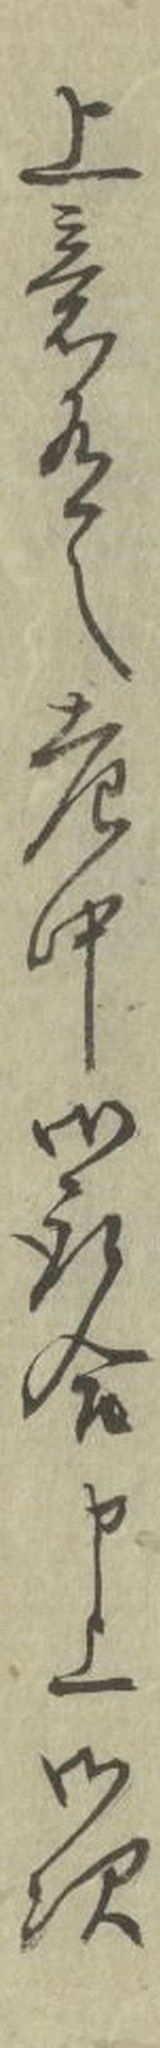上意有之老中御取合申上御次
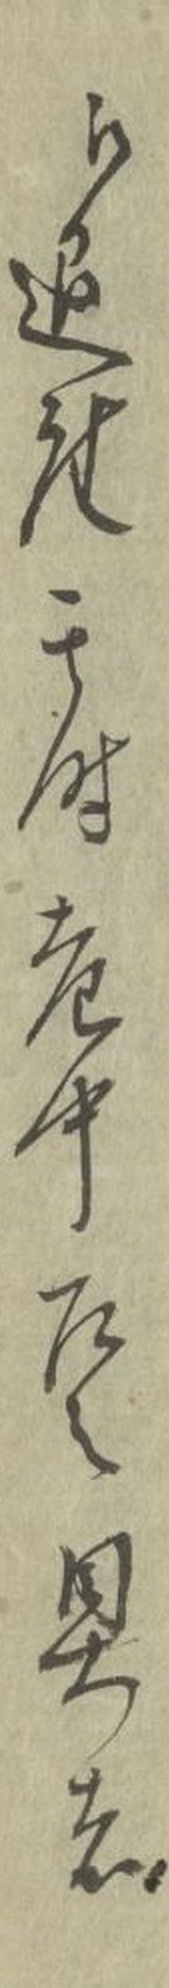え退座其時老中召之具志
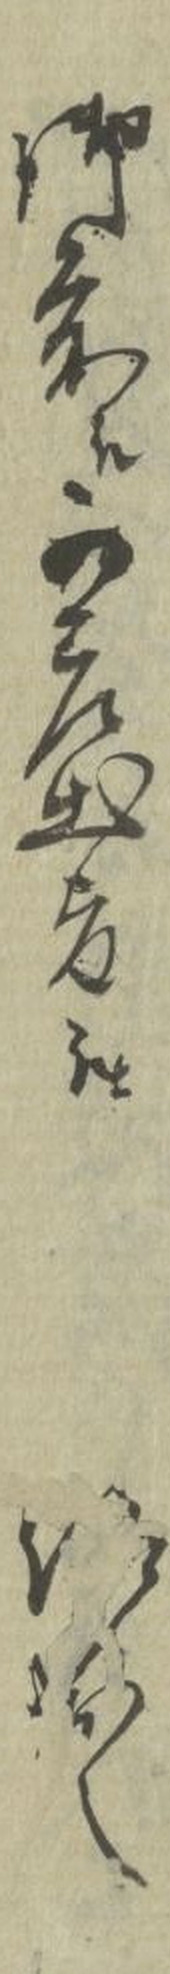御前え可差出旨被仰出之
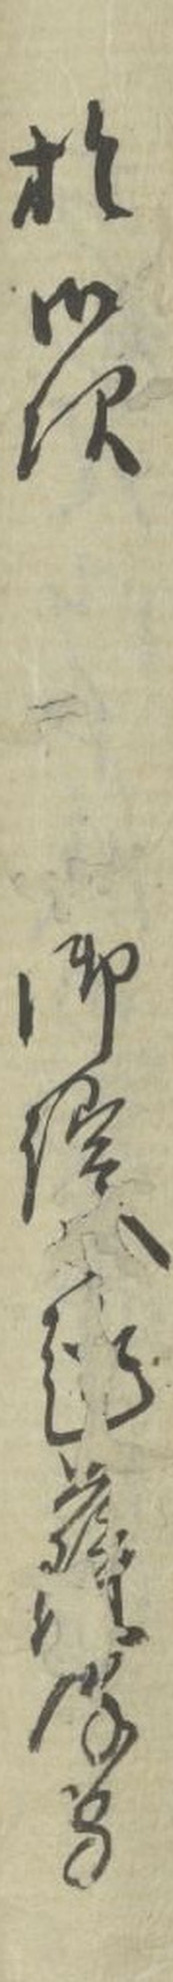於御次御諚之趣薩摩守
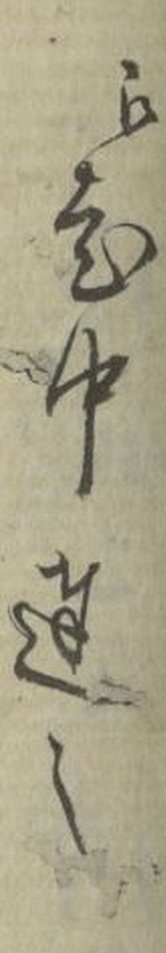え老中達之
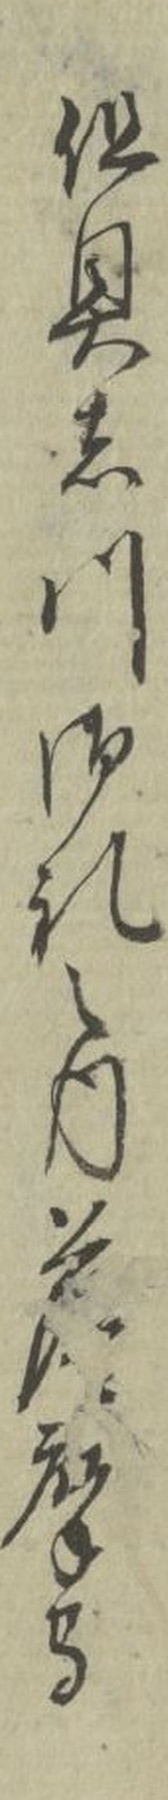但具志川御礼之内薩摩守
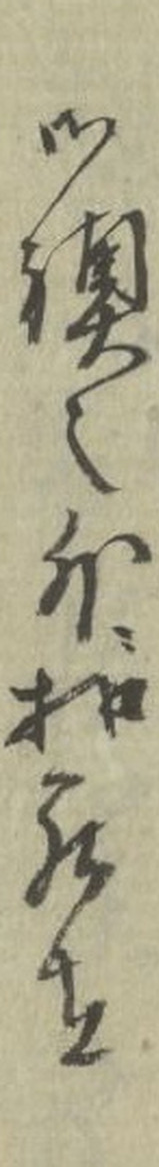御襖之外に控罷在
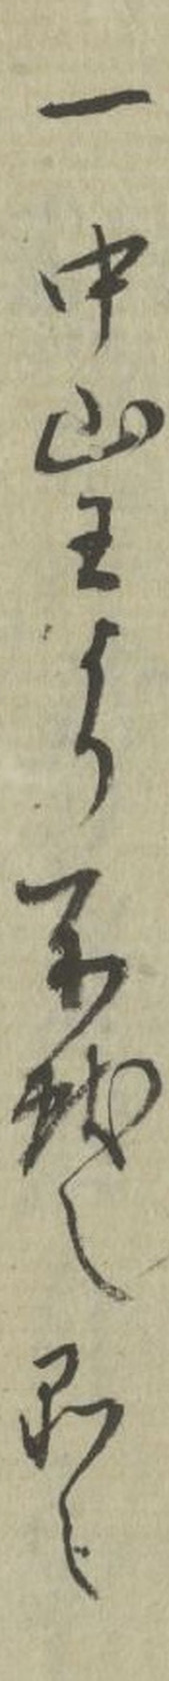一中山王より所献之品々
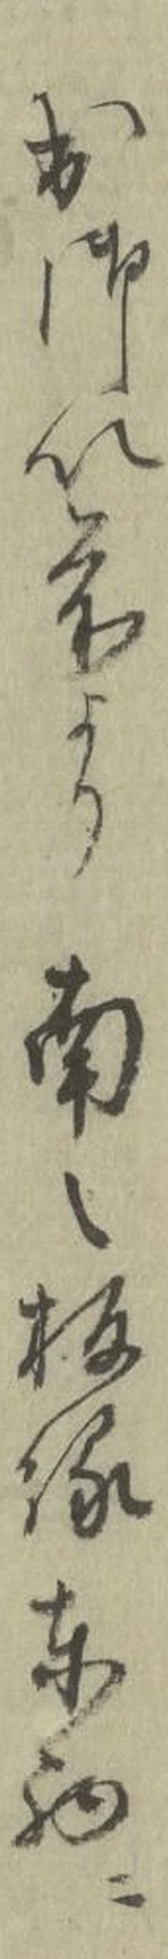出御以前より南之板縁東西に

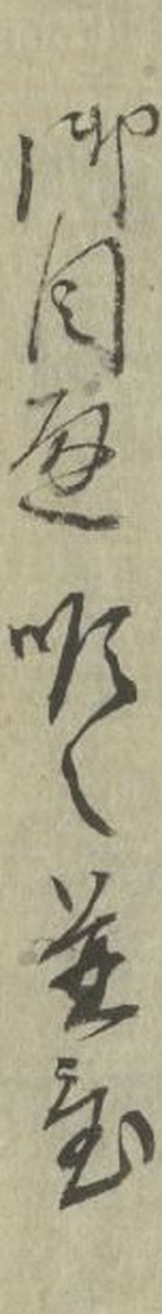御目通順々並置
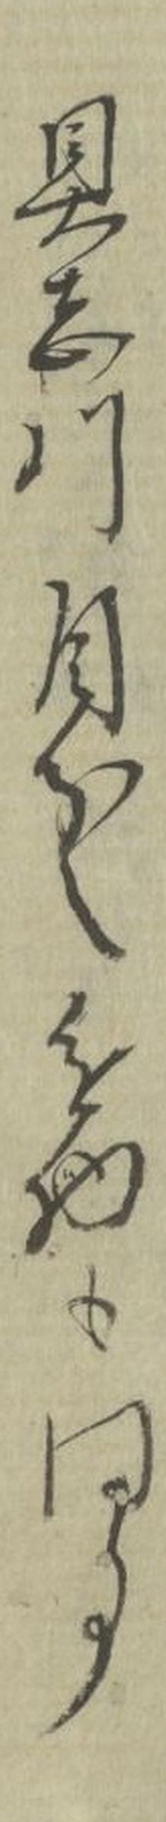具志川自分之進物も同事
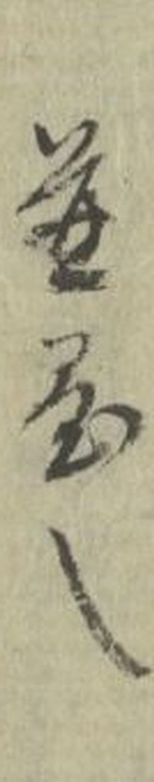並置之
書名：琉球来朝記 自八至十四終
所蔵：University of the Ryukyus Library
